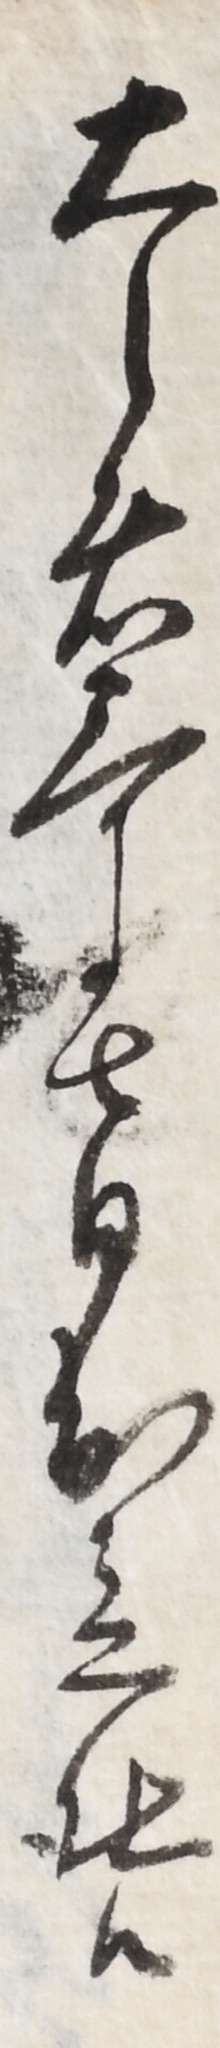右之者三月十日出立仕候
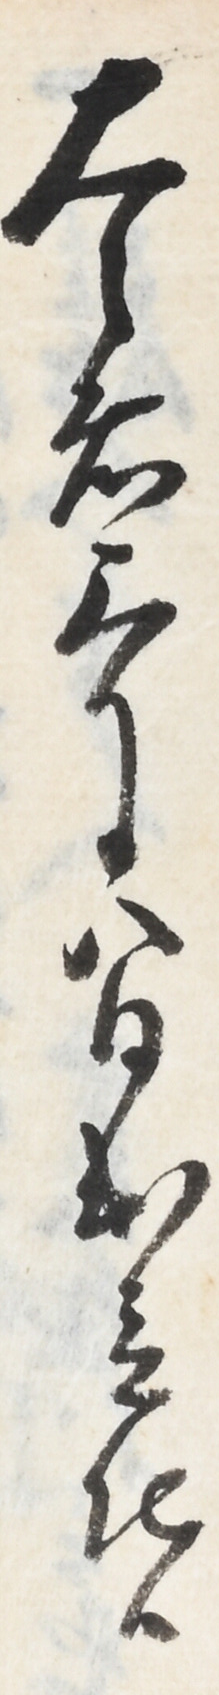右之者三月十日出立仕候
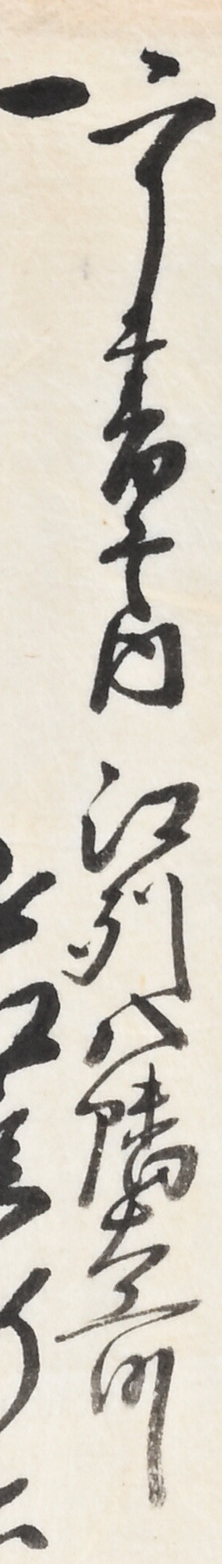二月書上之内江州八幡大工町
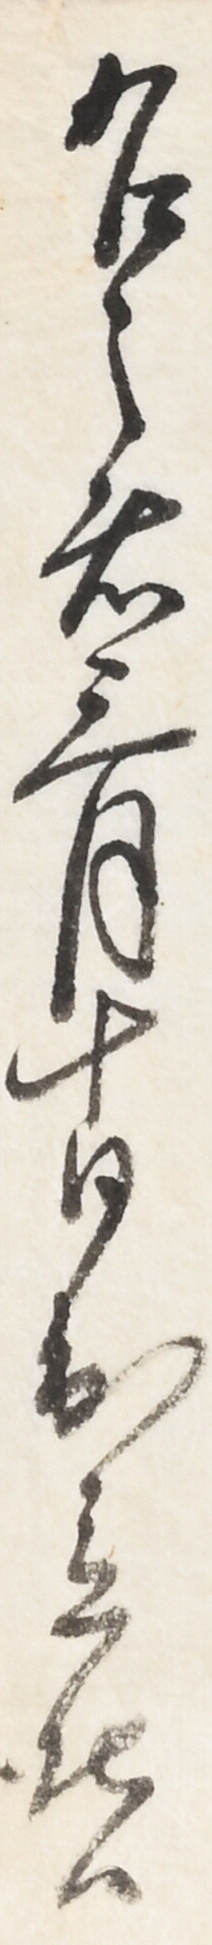右之者三月十日出立仕候
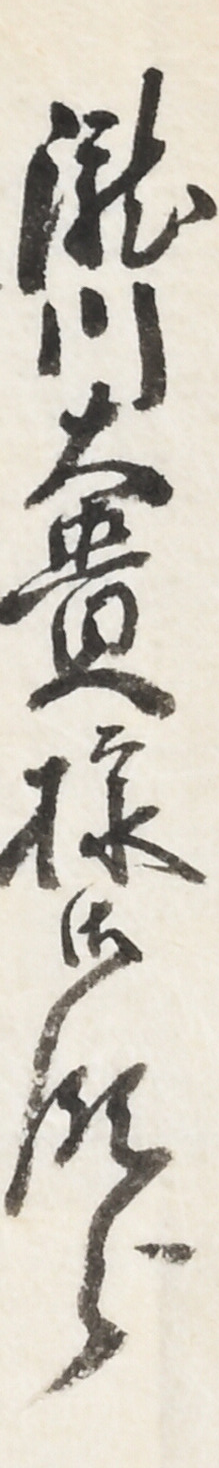瀧川大貴様御領分
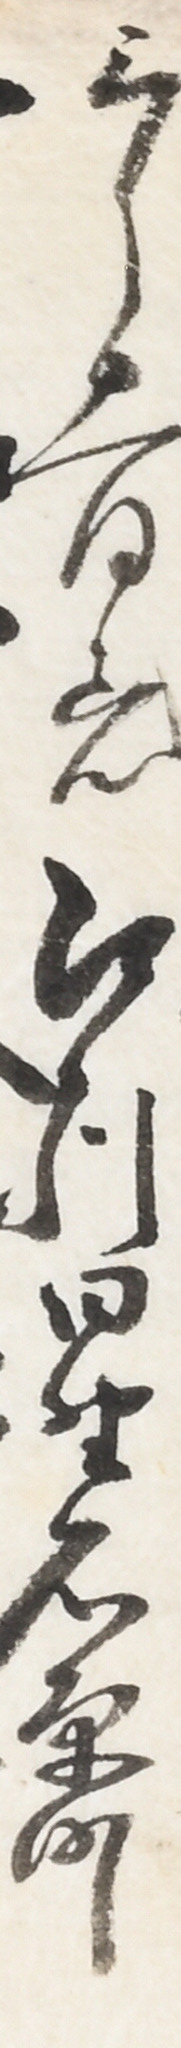三月十一日着江州田野石原町
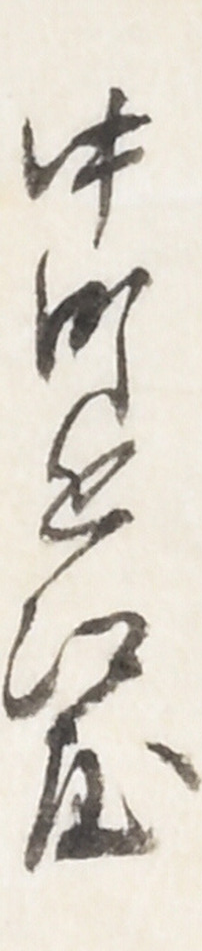中町近江屋
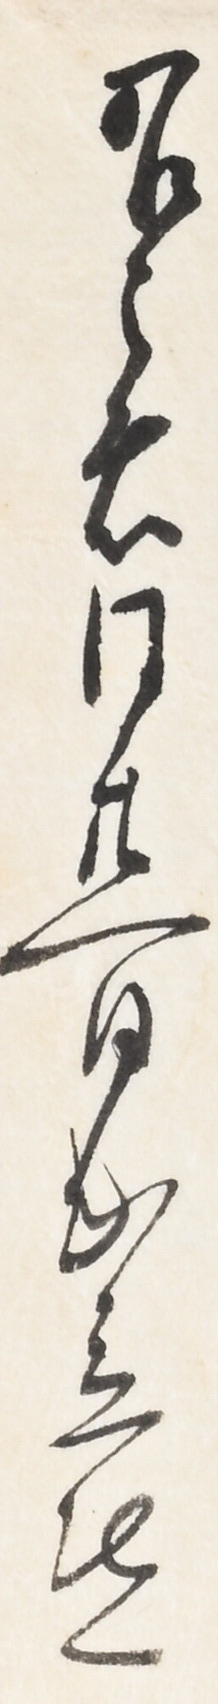右之者同廿一日出立仕候
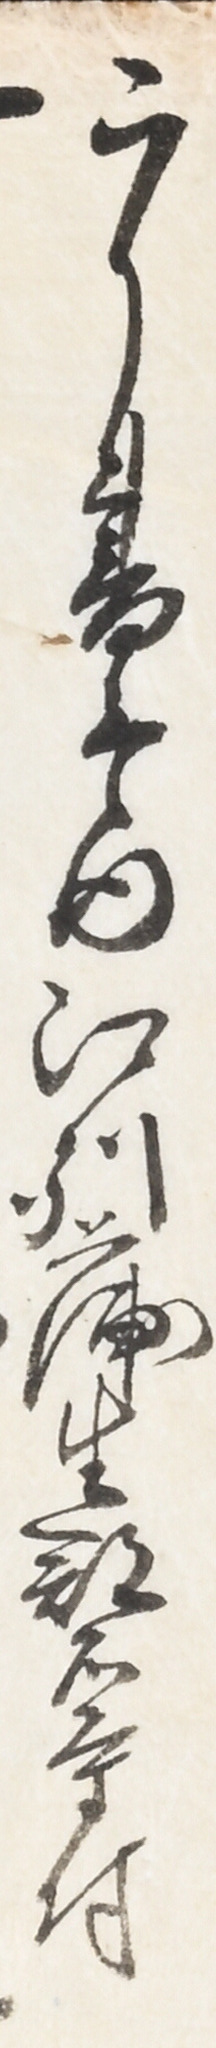二月書上之内江州蒲生郡石寺村
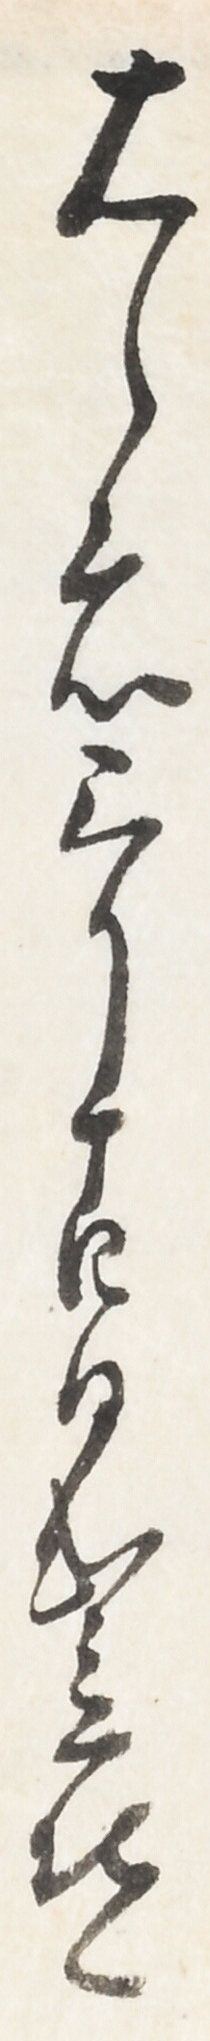右之者三月十四日出立仕候
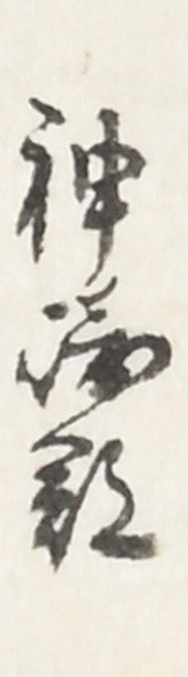神嶋郡
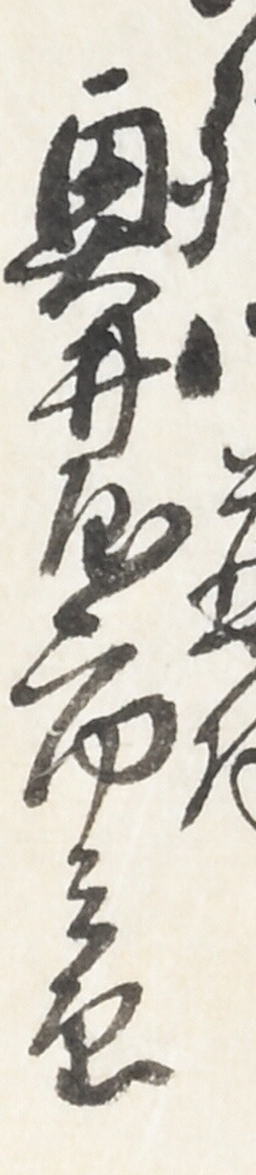一奥井屋市兵衛
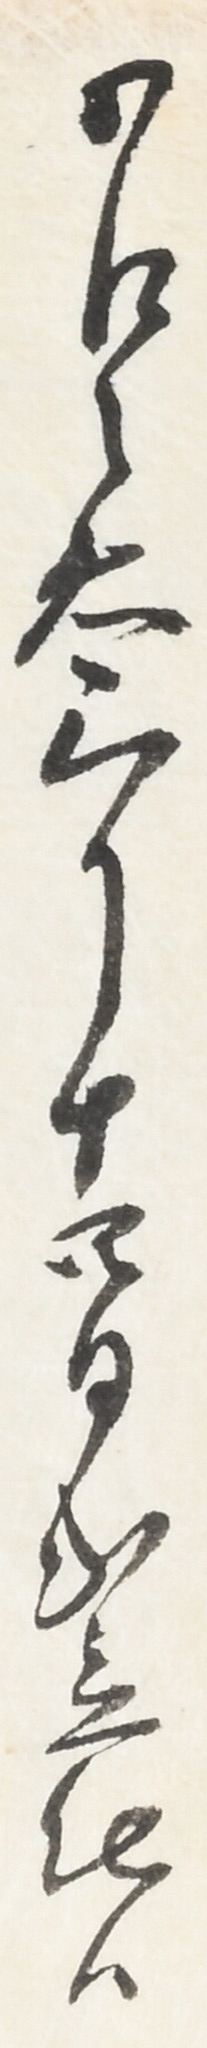右之者三月十四日出立仕候
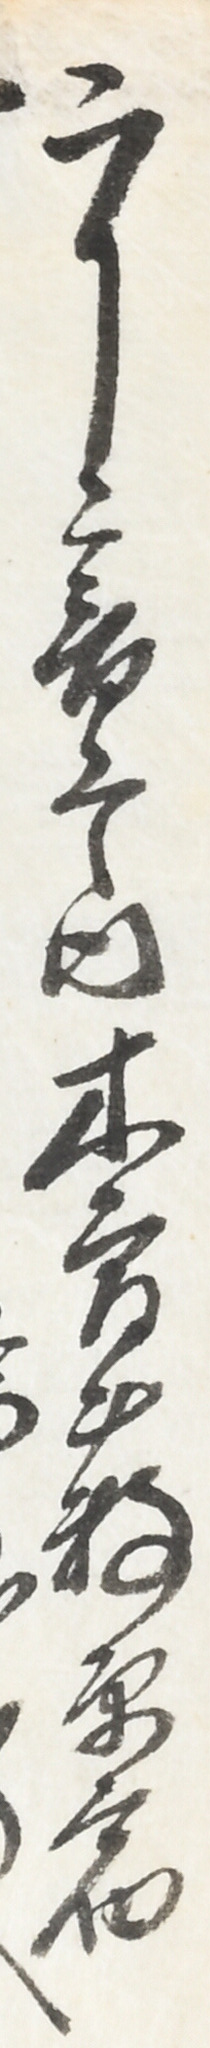二月書上之内木曽藪原宿
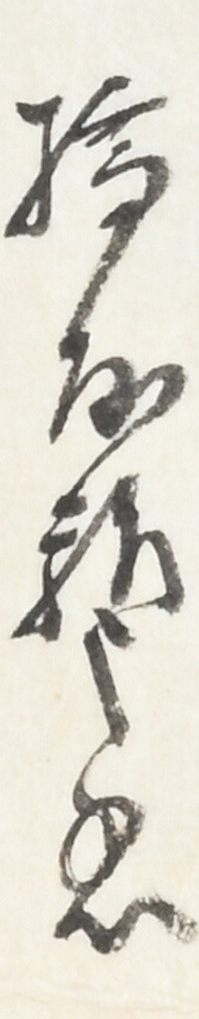樽屋新之丞
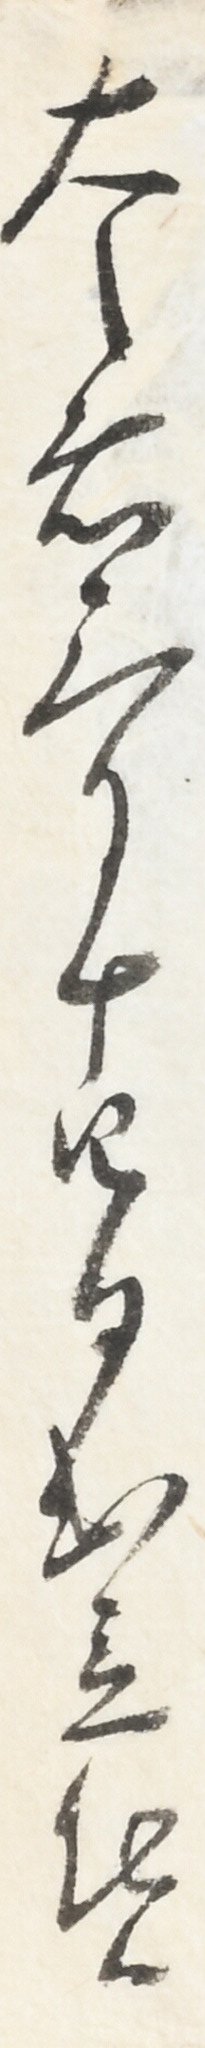右之者三月十四日出立仕候
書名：旅人泊控帳
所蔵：伊那市立高遠町図書館・合同会社AMANE
